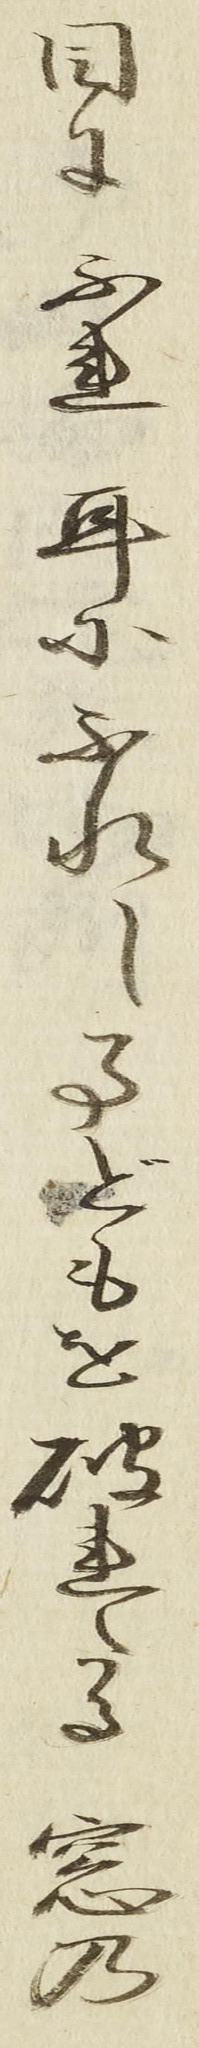目にふれ耳ににふれし事どもを破れたる窓の
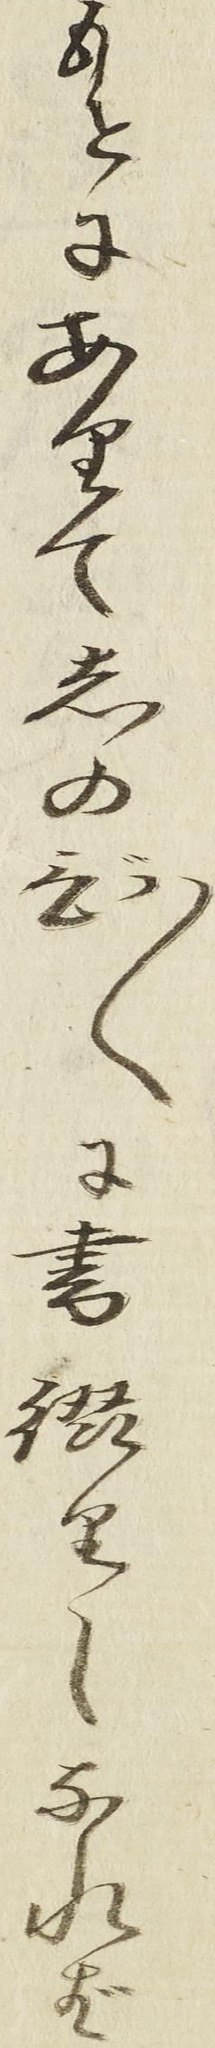もとにありてしのび〳〵に書綴りしなれば
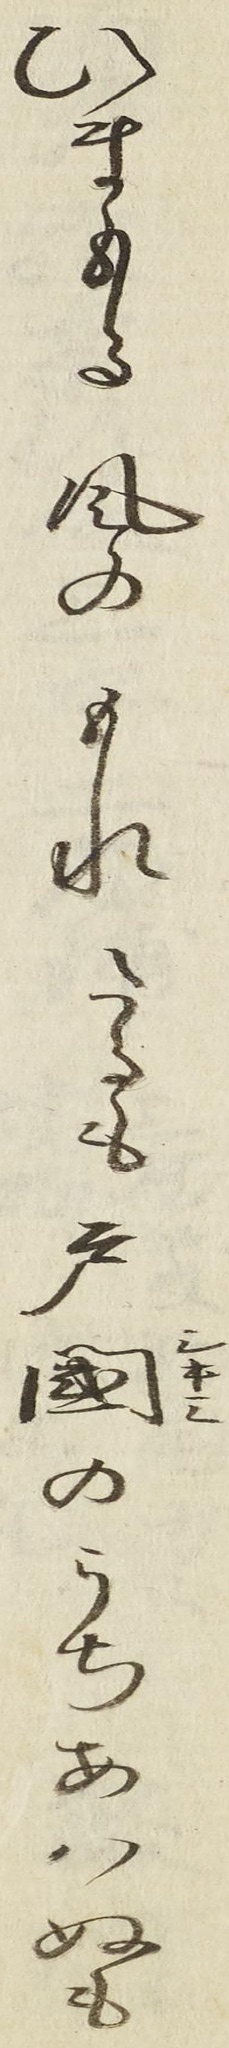ひまもる風のもれたるも戸閾のうちあはぬも
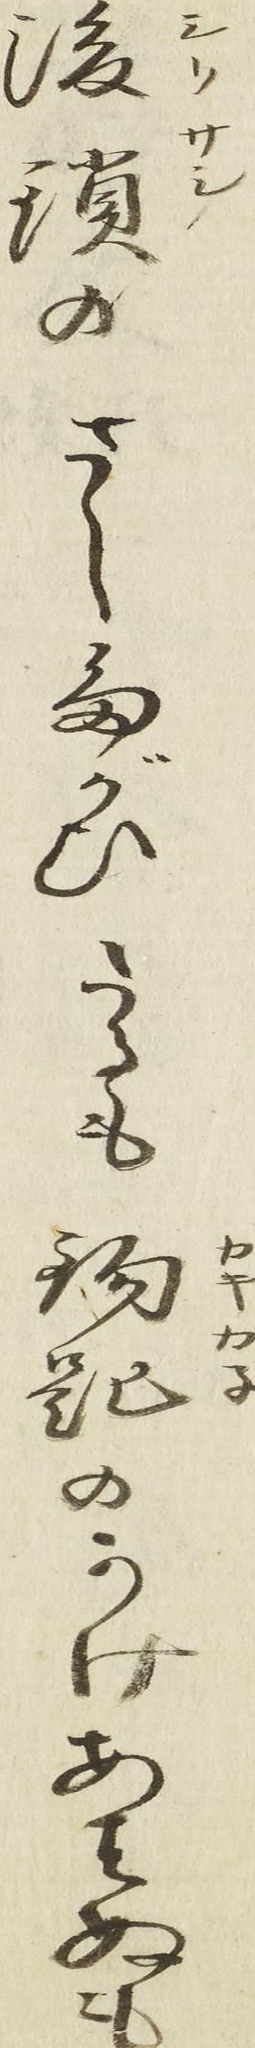後鎖のさしたがひたるも鉤匙のかけあはぬも
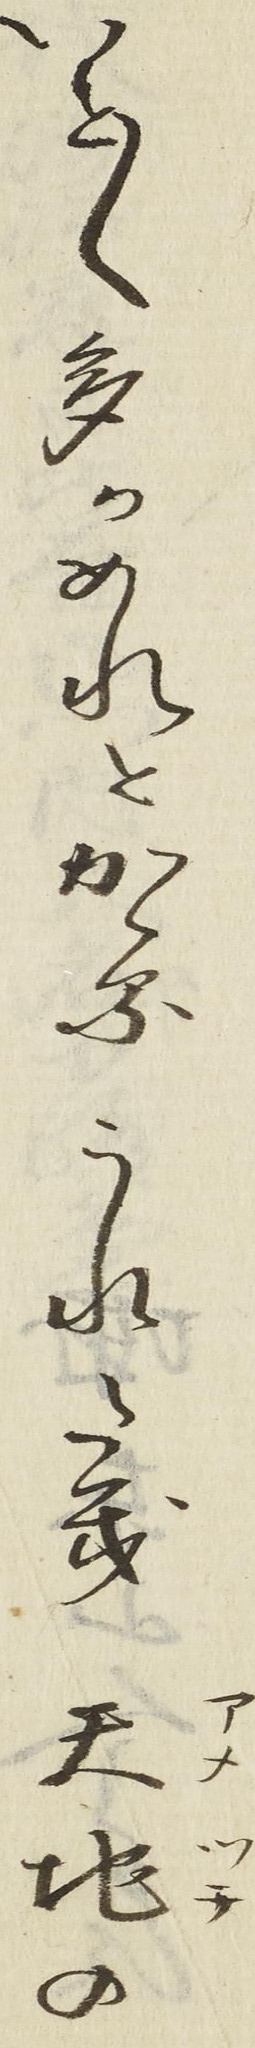いと〳〵多かめれとかゝるうれたき天地の
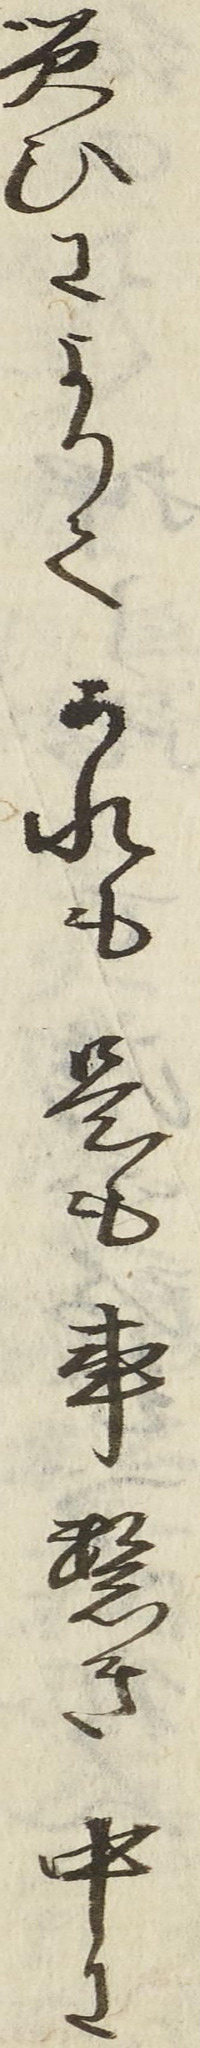災ひによりてかれも是も事驚き中に
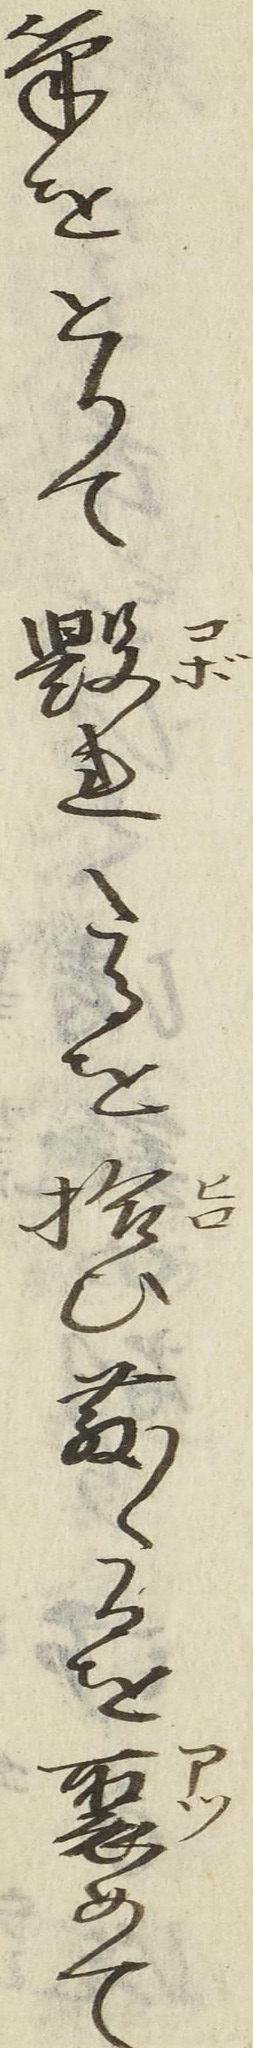筆をとりて毀れたるを拾ひ散たるを聚めて
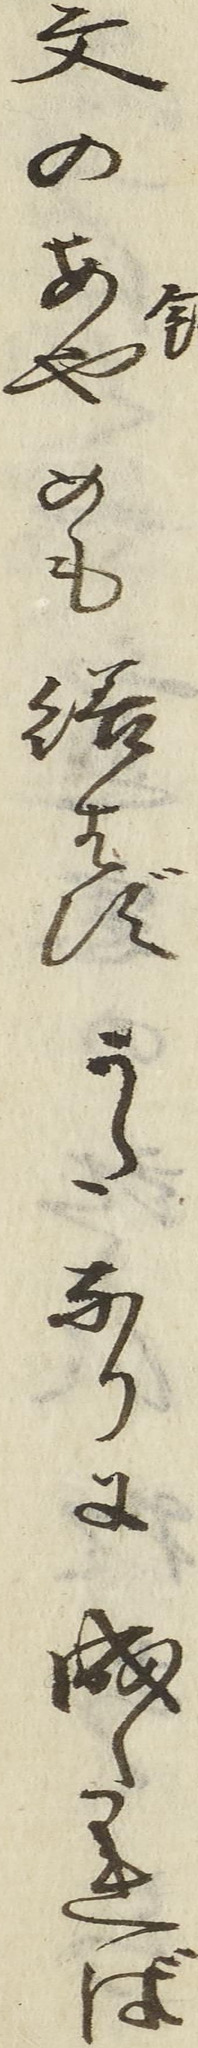文のあや飾めも繕はずかたなりに成たれば

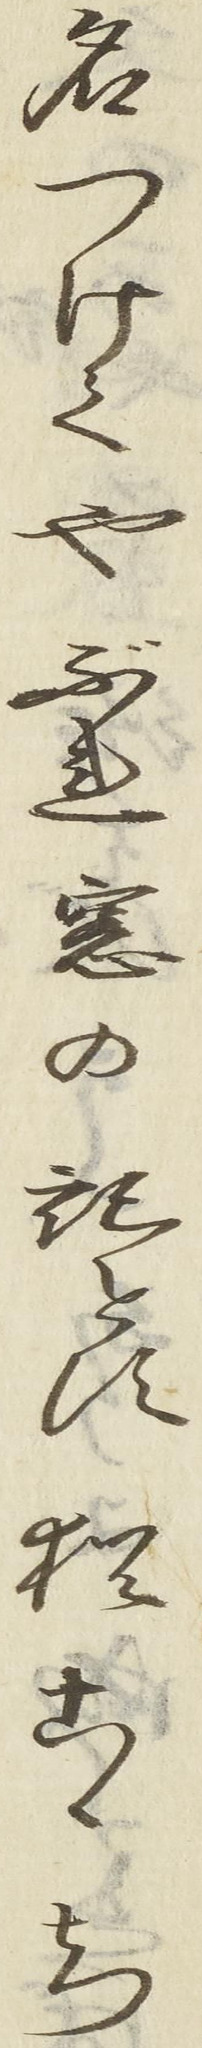名つけてやぶれ窓の記とす猶こゝち
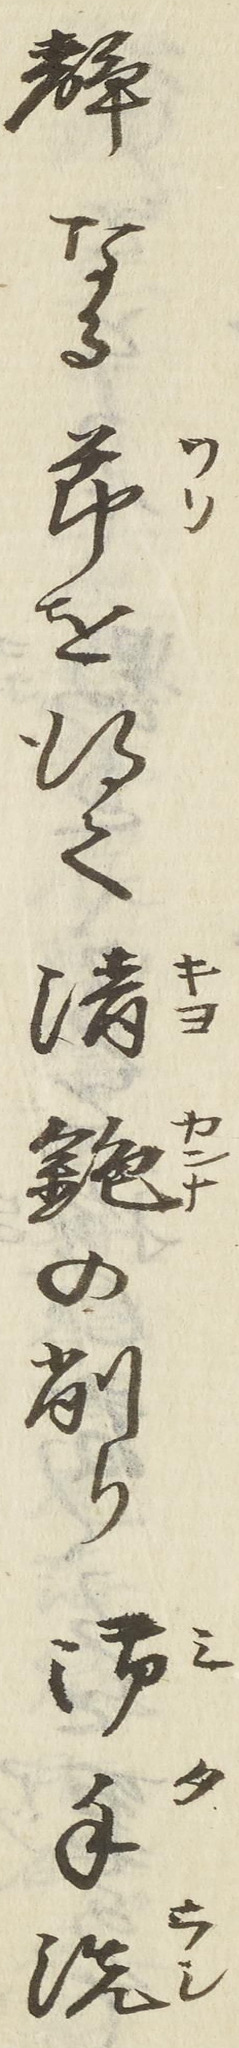静なる節を得て清鉋の削り御手洗
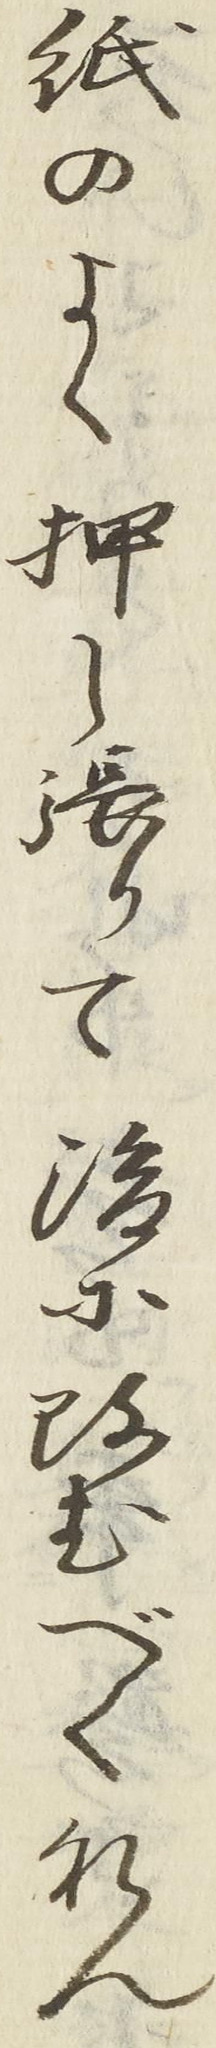紙のよく押し張りて後に改むべくなん
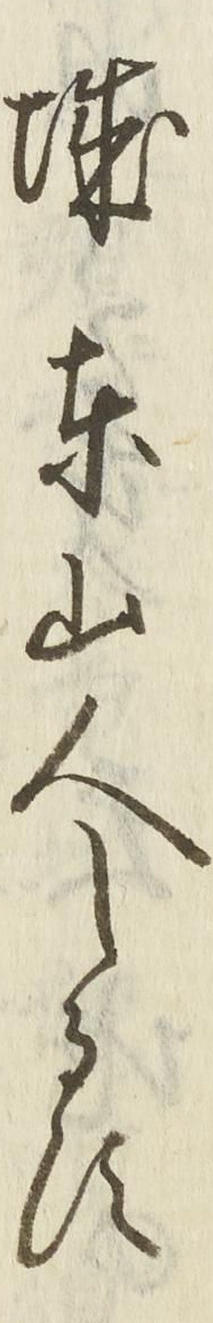城東山人しるす
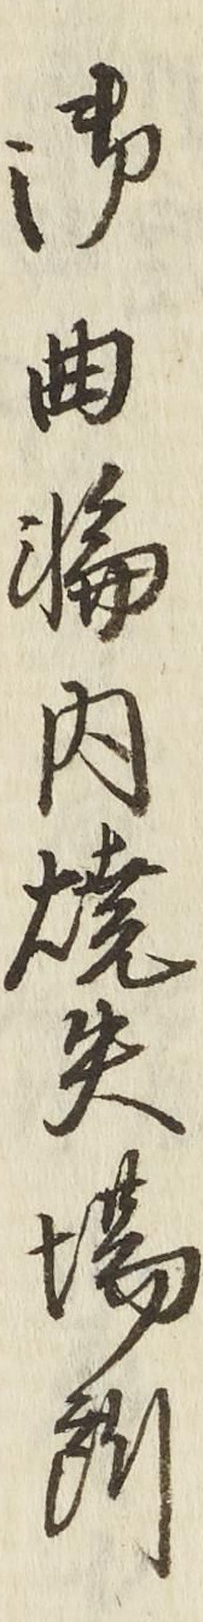御曲輪内焼失場所
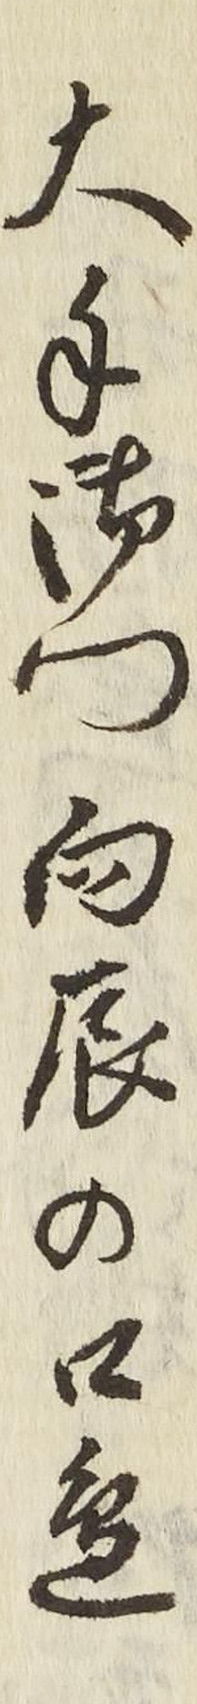大手御門向辰の口辺
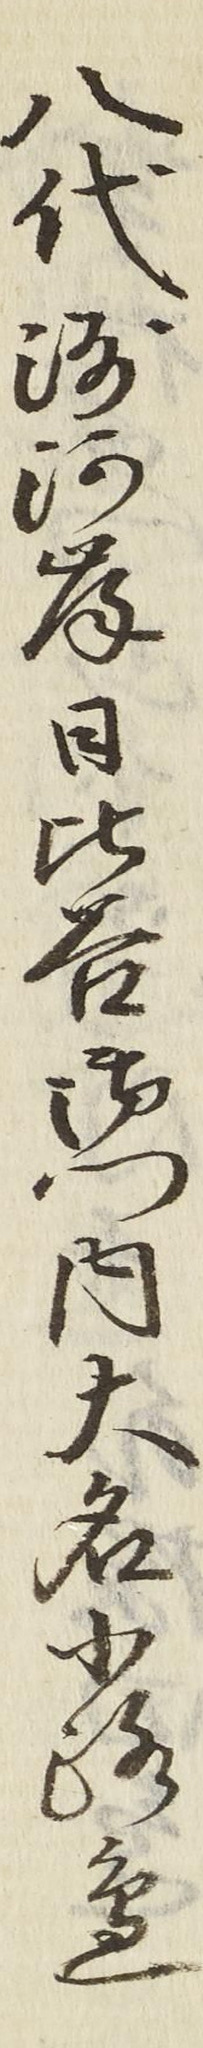八代洲河岸日比谷御門内大名小路辺
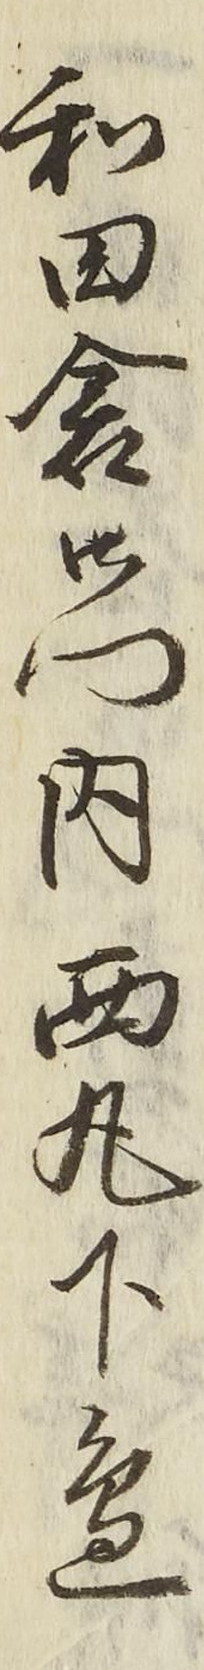和田倉御門内西丸下辺
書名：やぶれ窓の記　全
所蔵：東京大学地震研究所図書室 Earthquake Research Institute Library, The University of Tokyo, JAPAN
